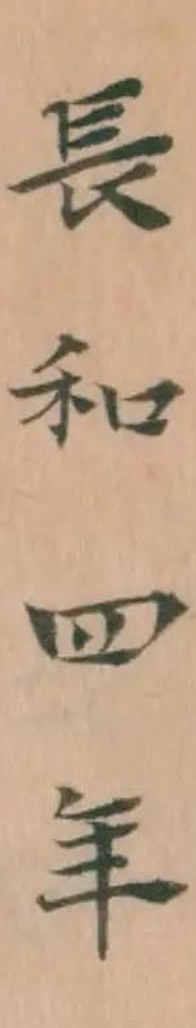長和四年
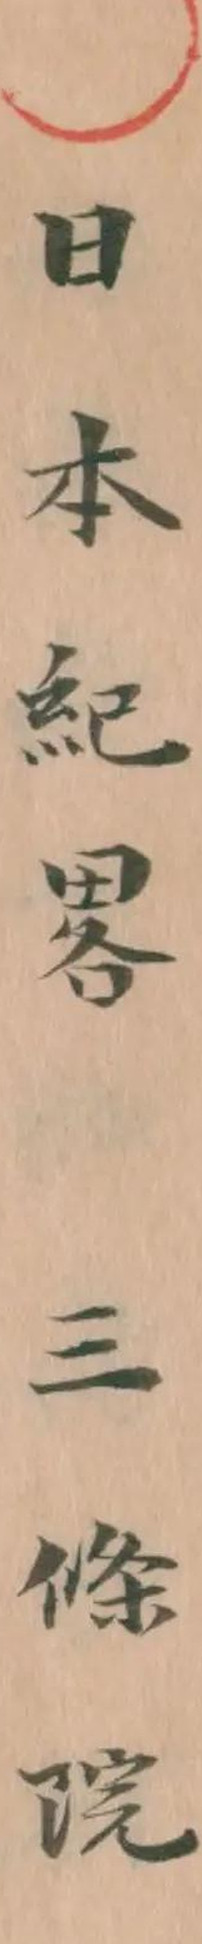○日本紀略三条院
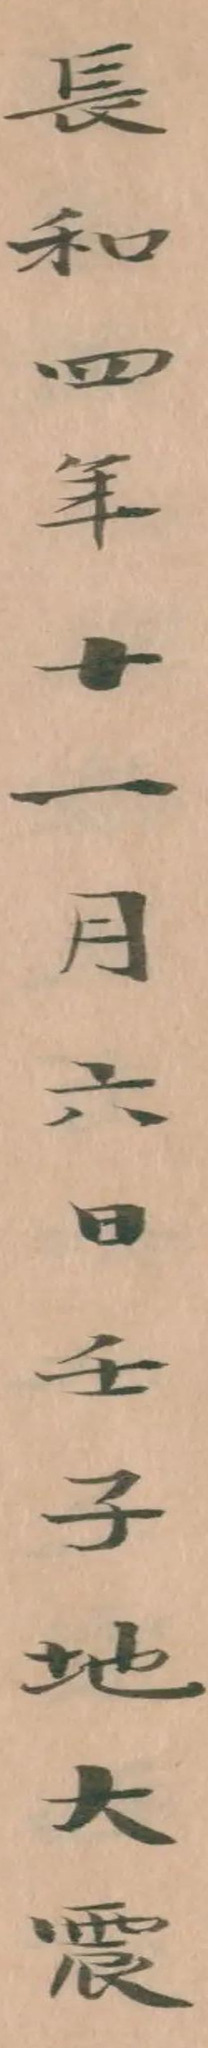長和四年十一月六日壬子地大震
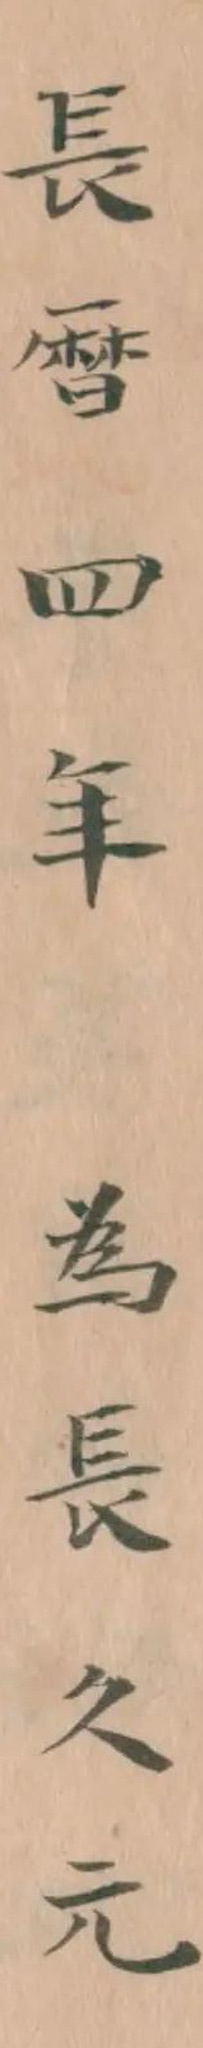長暦四年為長久元
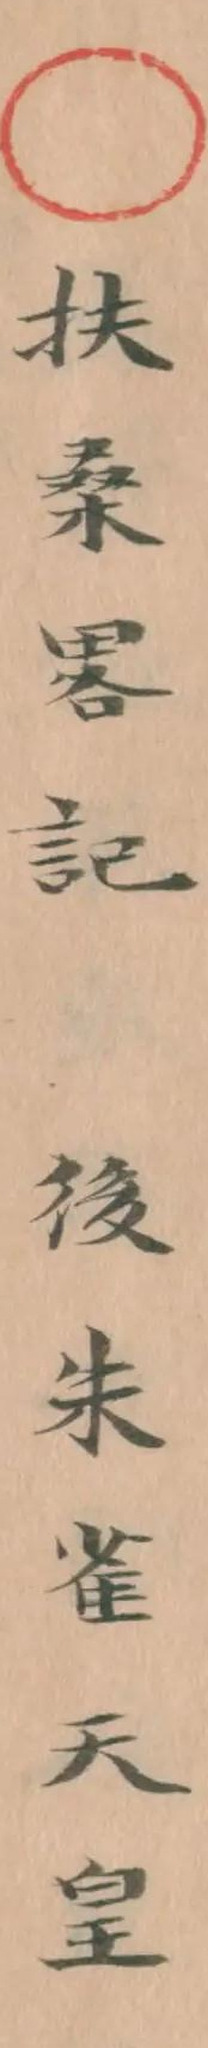○扶桑略記後朱雀天皇

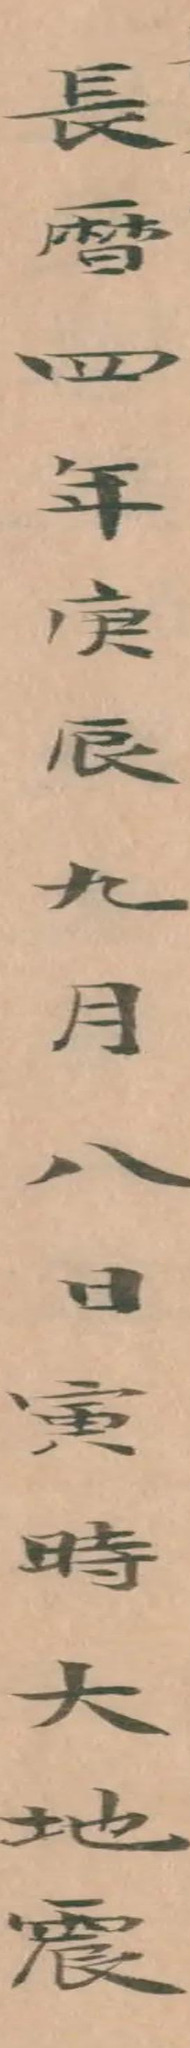長暦四年庚辰九月八日寅時大地震
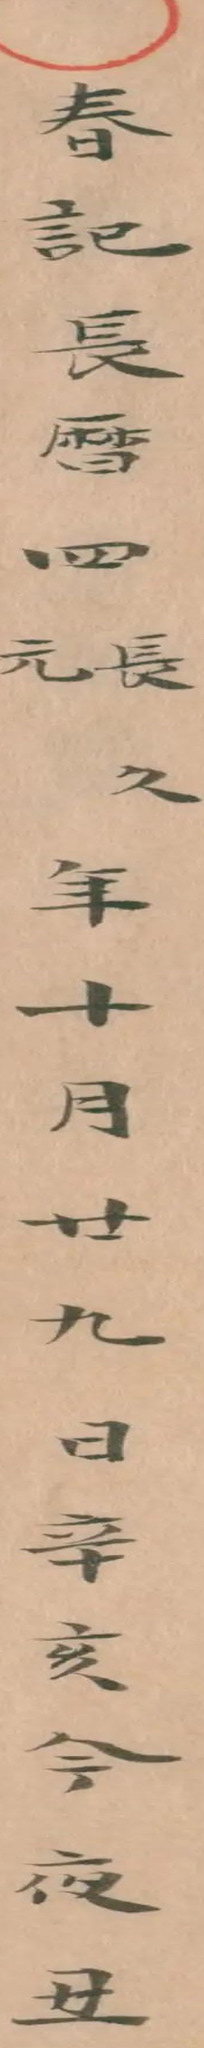○春気長暦四長久元年十月廿九日辛亥今夜丑
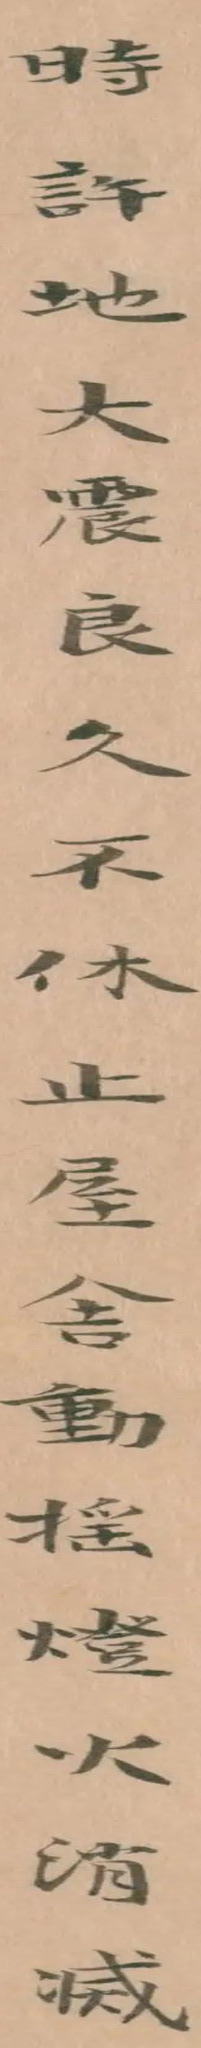時許地大震良久不休止屋舎動揺燈火消滅
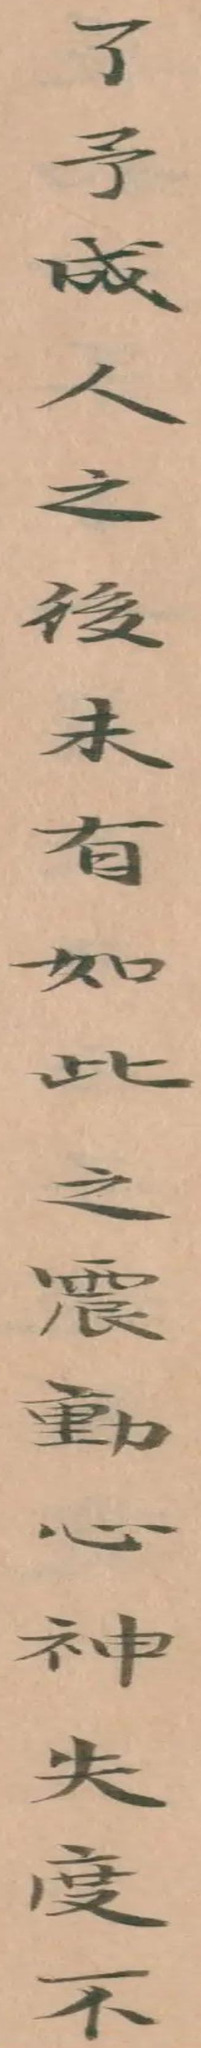了予成人之後未有如此之震動心神失度不
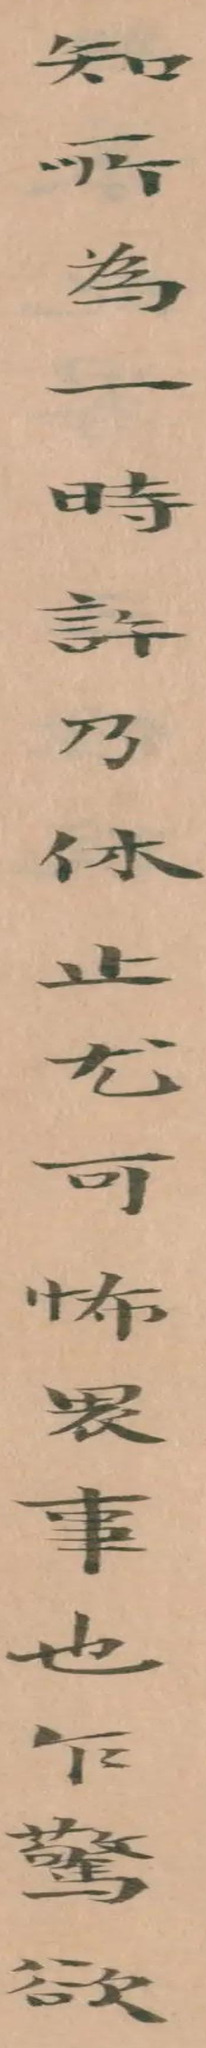知所為一時許乃休止尤可怖畏事也乍驚欲
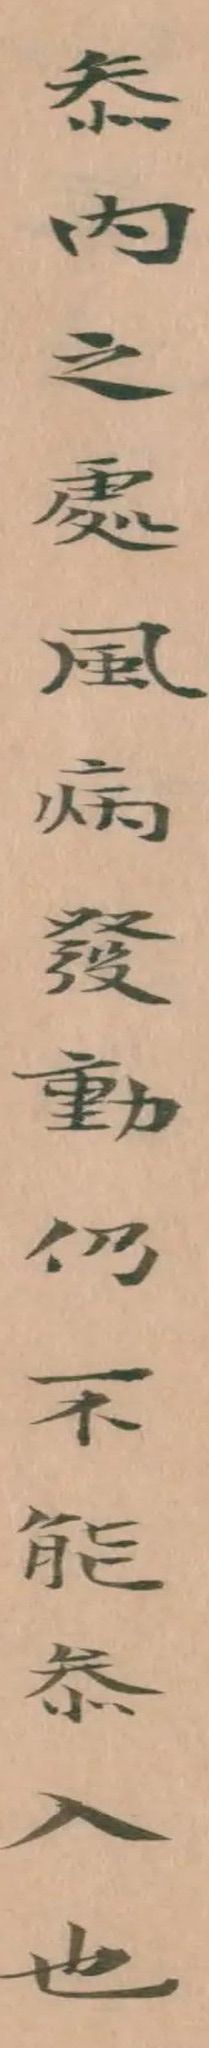参内之処風病発動仍不能参入也
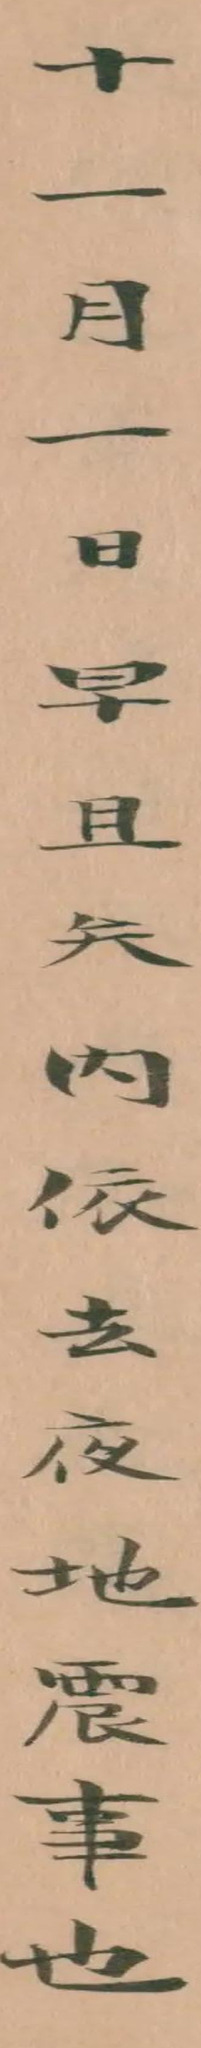十一月一日早且参内依去夜地震事也
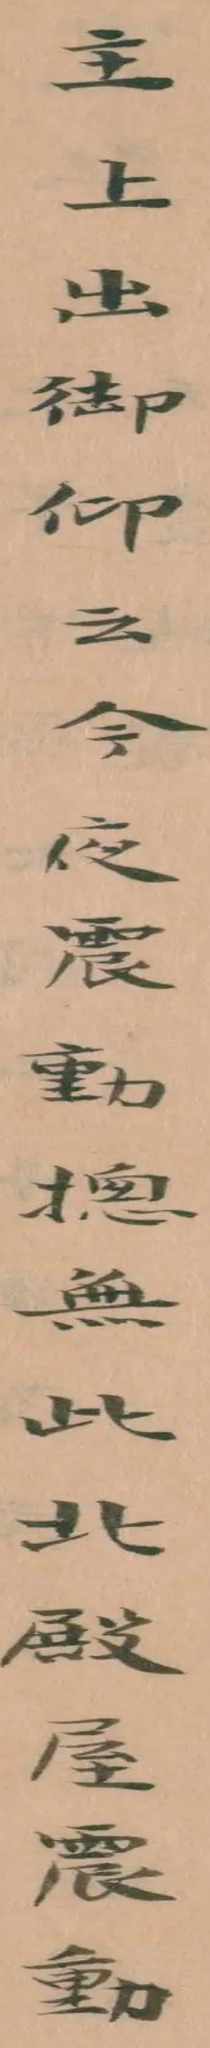主上出御仰云今夜震動総無此北殿屋震動
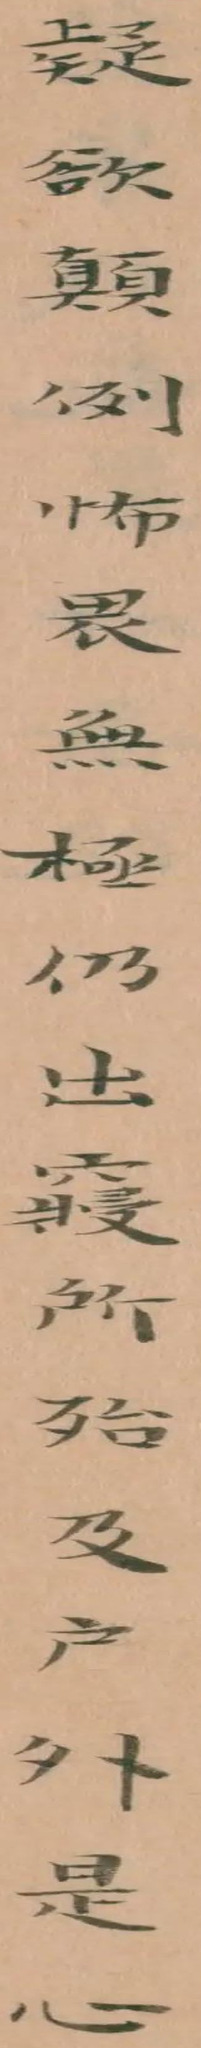疑欲顛倒怖畏無極仍出寝所殆及戸外是心
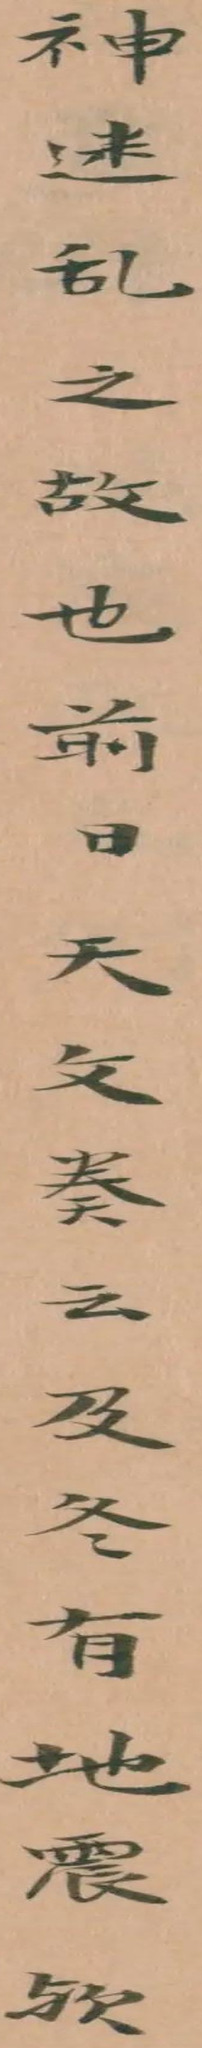神迷乱之故也前日天文奏云及冬有地震歟
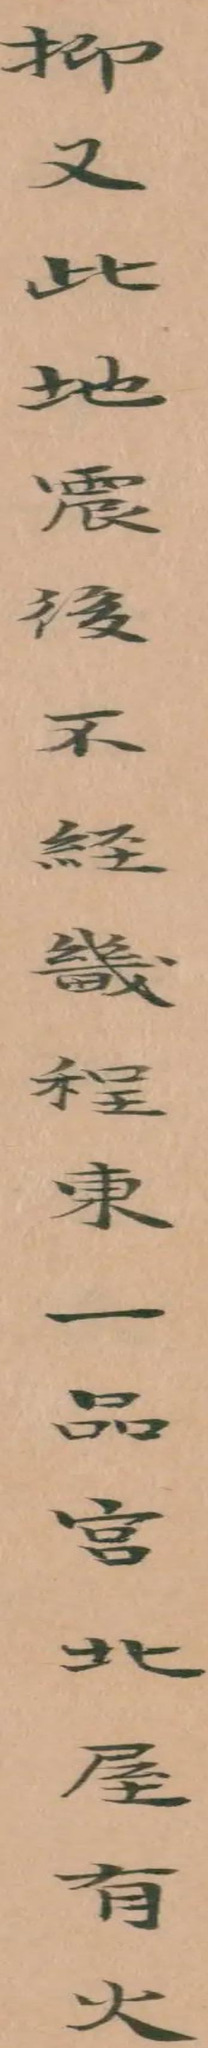抑又此地震後不経幾程東一品宮北屋有火
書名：地災撮要. 巻5-6(地震之部)
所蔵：国立国会図書館 National Diet Library, JAPAN
